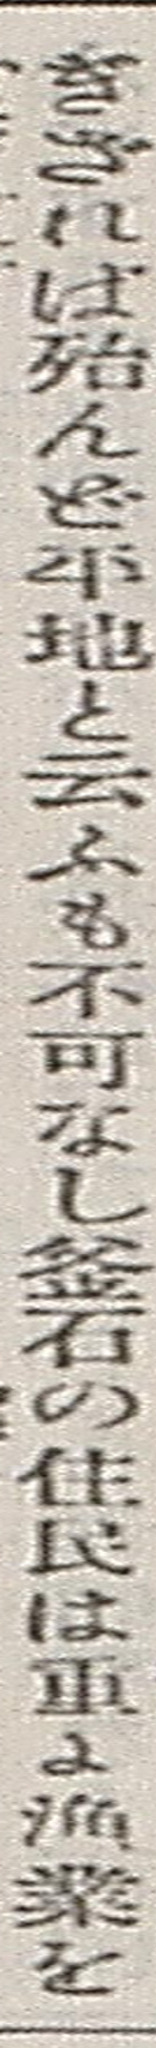ぎざれば殆んど平地と云ふも不可なし釜石の住民は重に漁業を
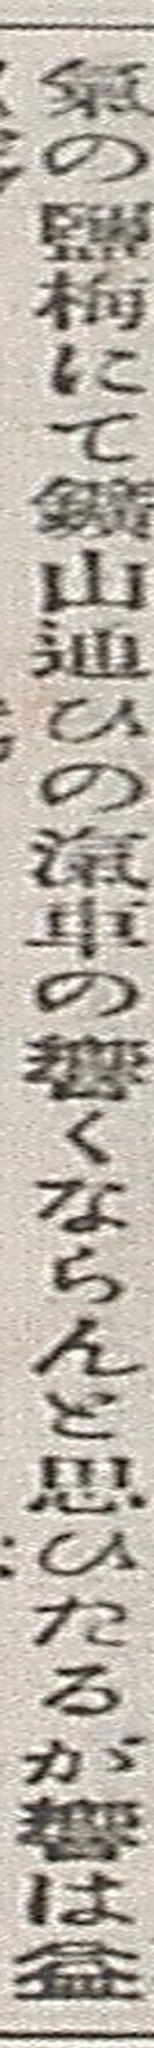気の塩梅にて鉱山通ひの汽車の響くならんと思ひたるが響は益
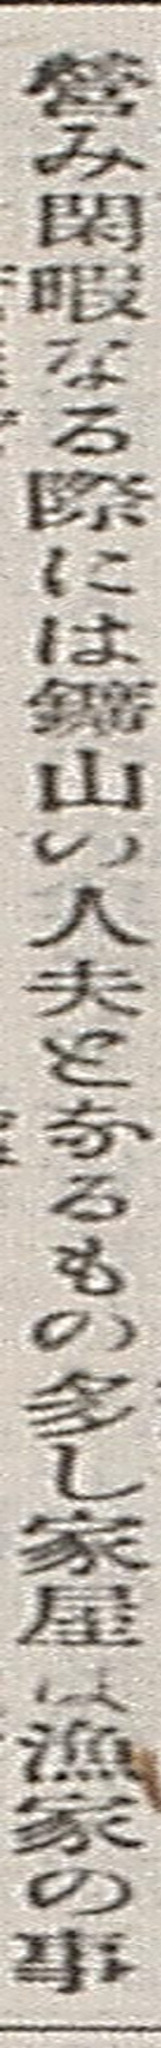営み閑暇なる際には鉱山の人夫となるもの多し家屋は漁家の事
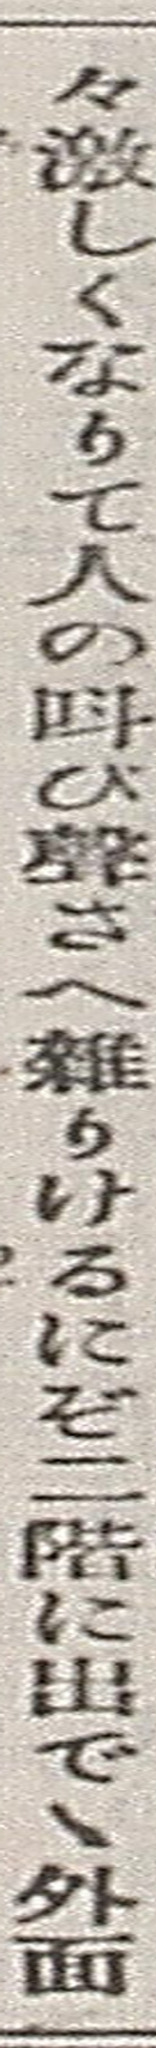々激しくなりて人の叫び声さへ雑りけるにぞ二階に出でゝ外面
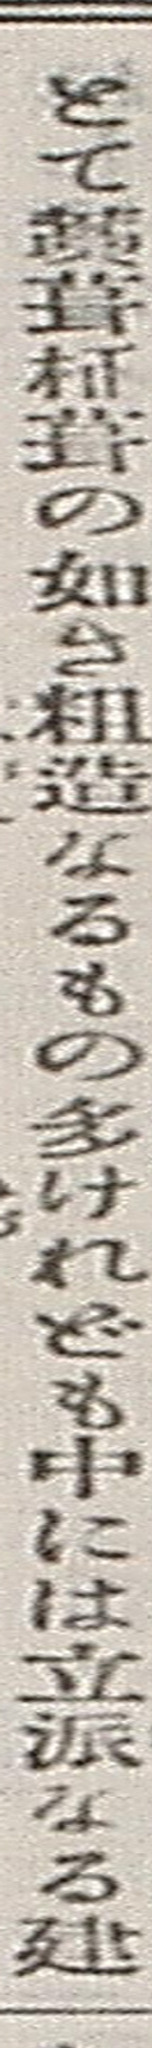とて藁葺柾葺の如き粗造なるもの多けれども中には立派なる建
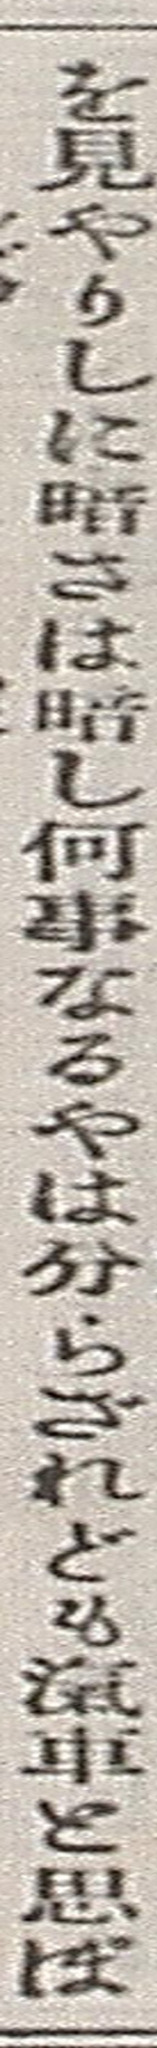を見やりしに暗さは暗し何事なるやは分らざれども汽車と思ぼ
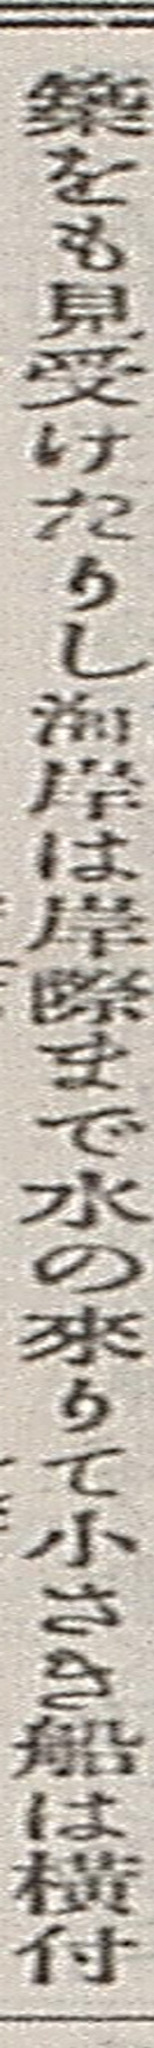築をも見受けたりし海岸は岸際まで水の来りて小さき船は横付
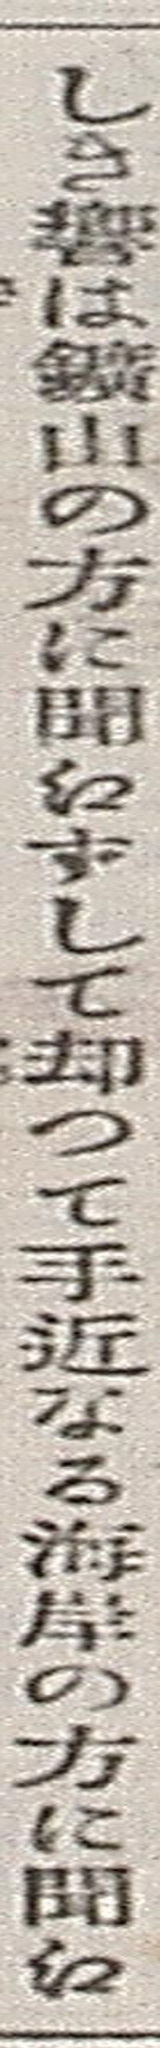しき響は鉱山の方に聞えずして却つて手近なる海岸の方に聞え
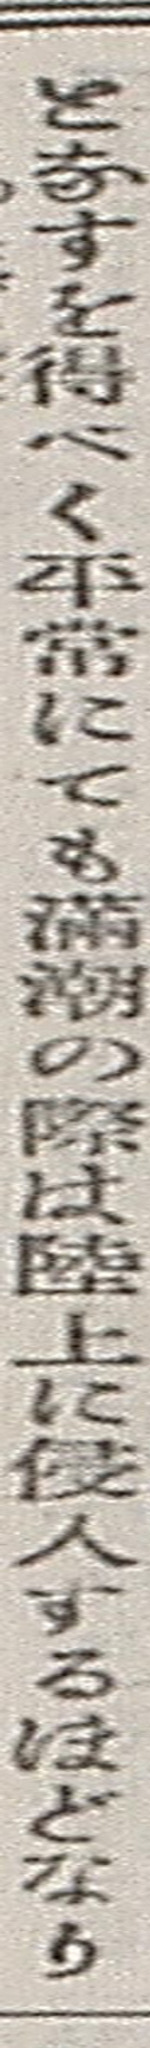となすを得べく平常にても満潮の際は陸上に侵入するほどなり
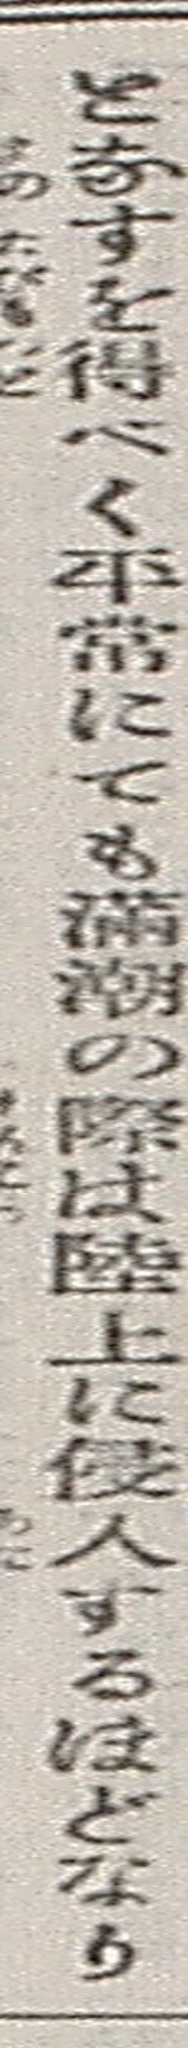となすを得べく平常にても満潮の際は陸上に侵入するほどなり
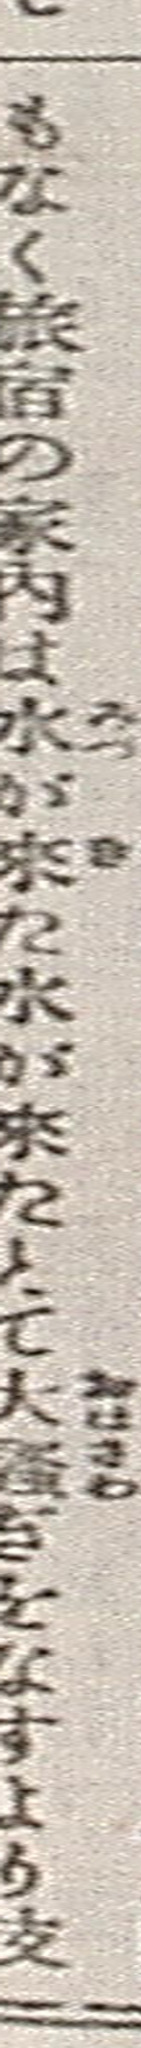もなく旅宿の家内は水が来た水が来たとて大騒ぎをなすより技
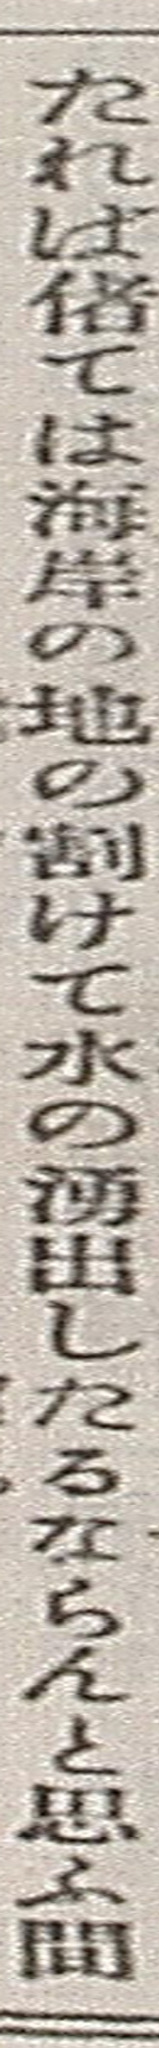たれば偖ては海岸の地の割けて水の湧出したるならんと思ふ間
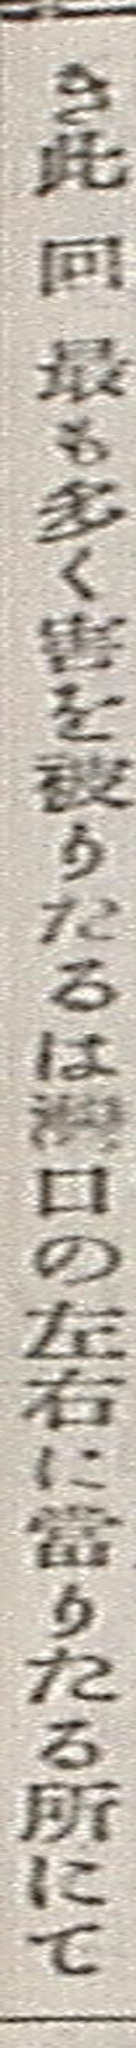き此回最も多く害を被りたるは湾口の左右に当りたる所にて
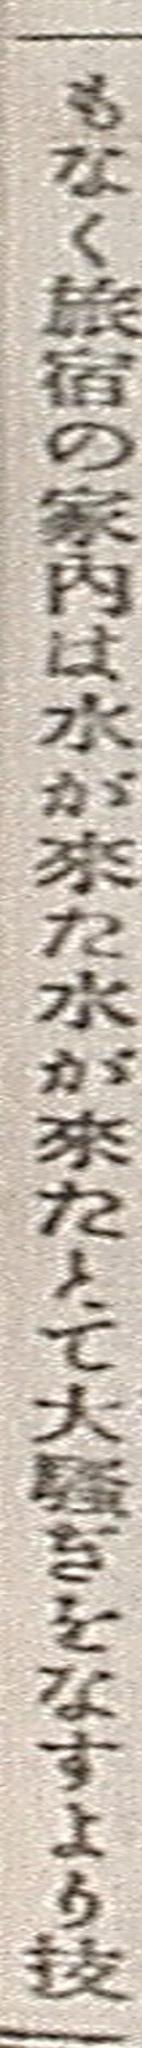もなく旅宿の家内は水が来た水が来たとて大騒ぎをなすより技

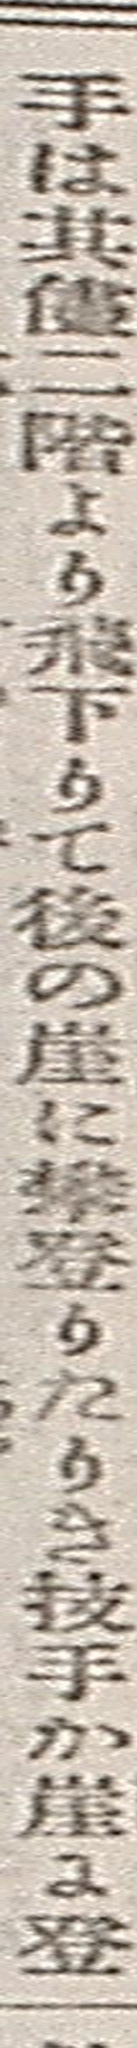手は其侭二階より飛下りて後の崖に攀登りたりき技手か崖に登
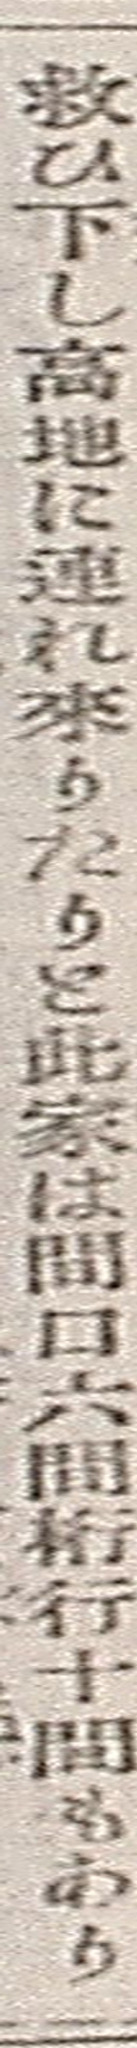救ひ下し高地に連れ来りたりと此家は間口六間桁行十間もあり
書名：風俗畫報臨時増刊第百二十號　大海嘯被害録（下）
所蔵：東京大学地震研究所図書室 Earthquake Research Institute Library, The University of Tokyo, JAPAN
